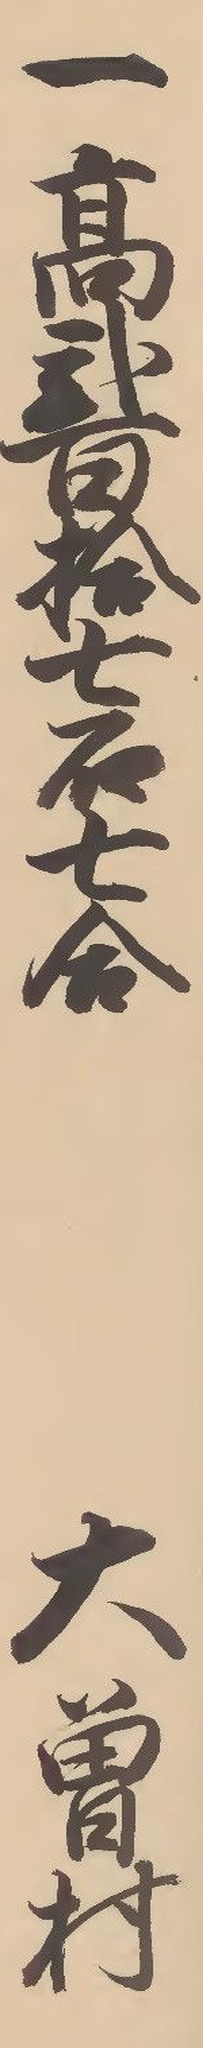一高弐百拾七石七合大曽村
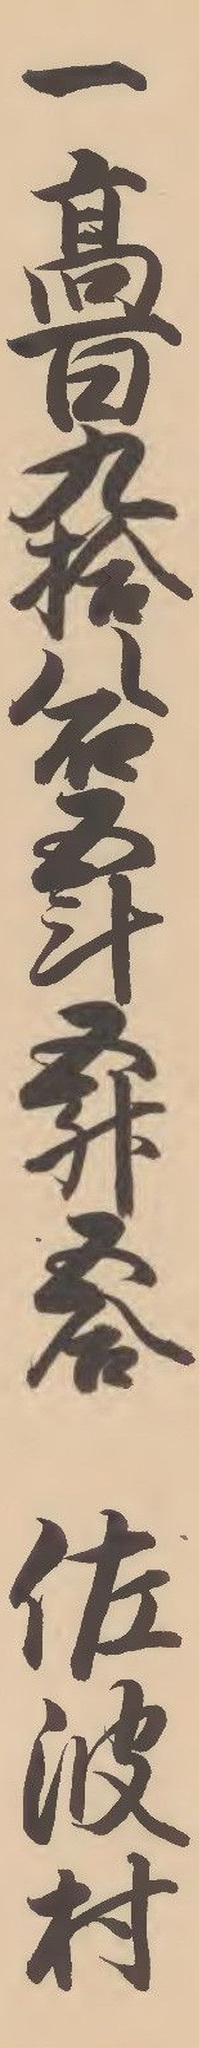一高百九拾八石五斗五升五合佐波村
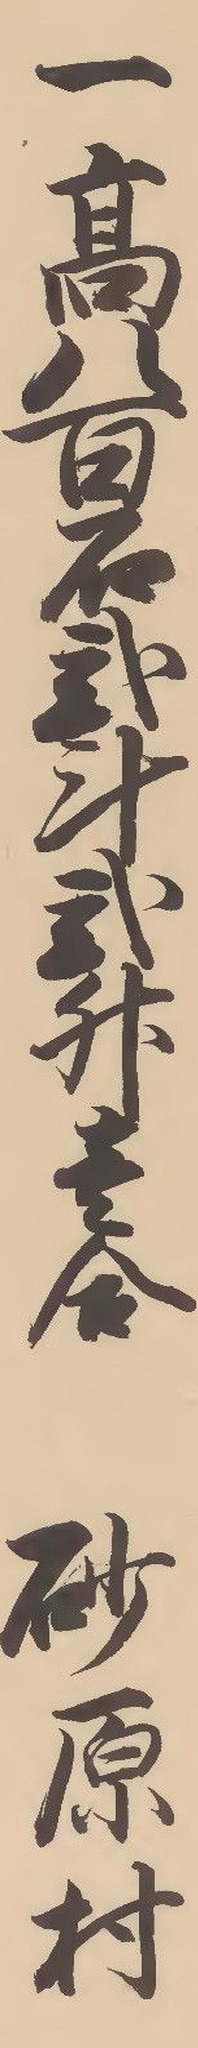一高八百石弐斗弐升壱合砂原村
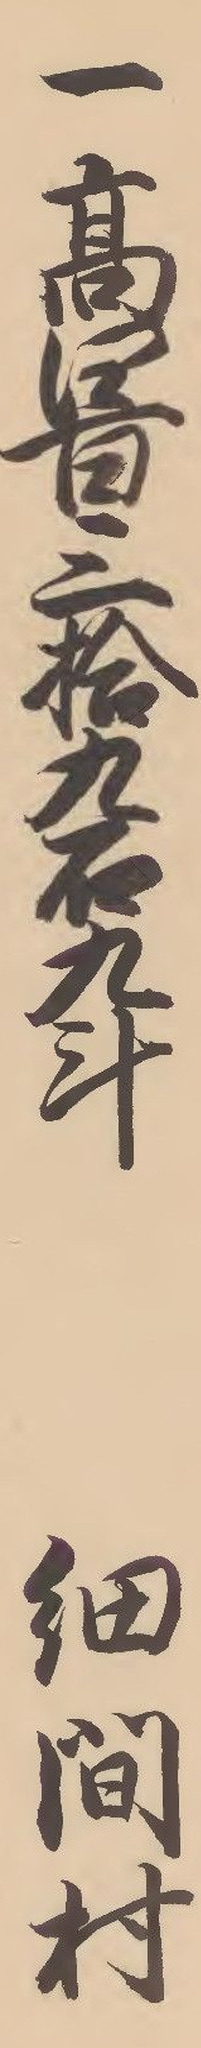一高四百三拾九石九斗細間村

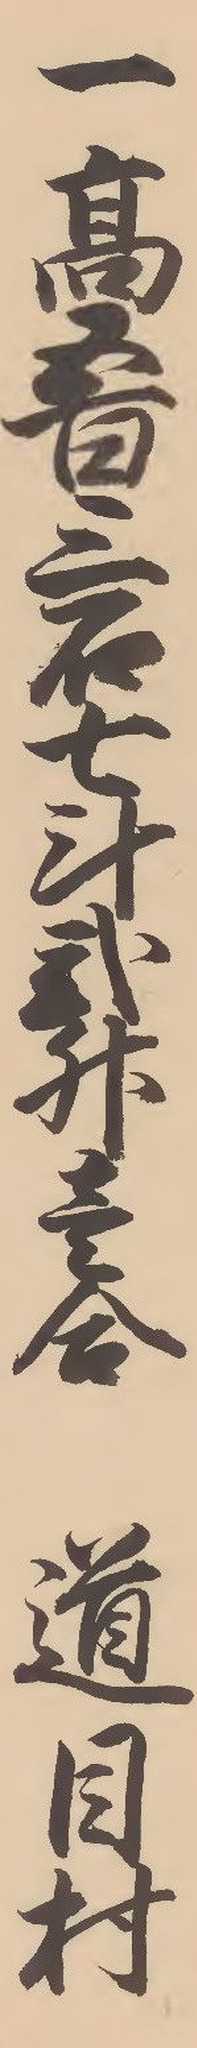一高五百三石七斗弐升壱合道目村
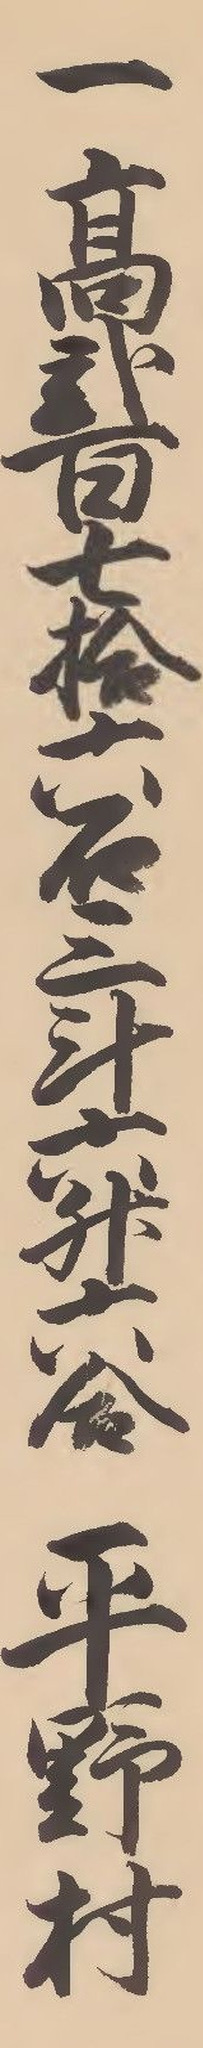一高弐百七拾六石三斗六升六合平野村
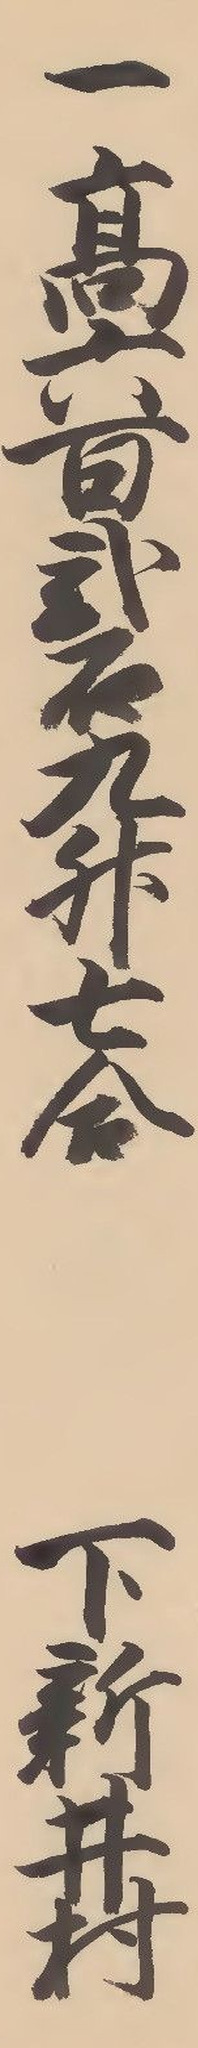一高六百弐石九升七合下新井村
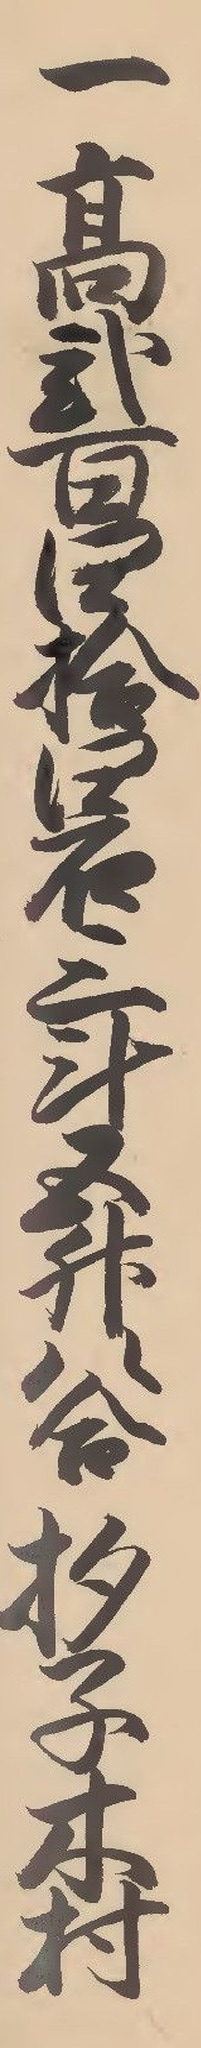一高弐百四拾四石三斗五升八合杓子木村
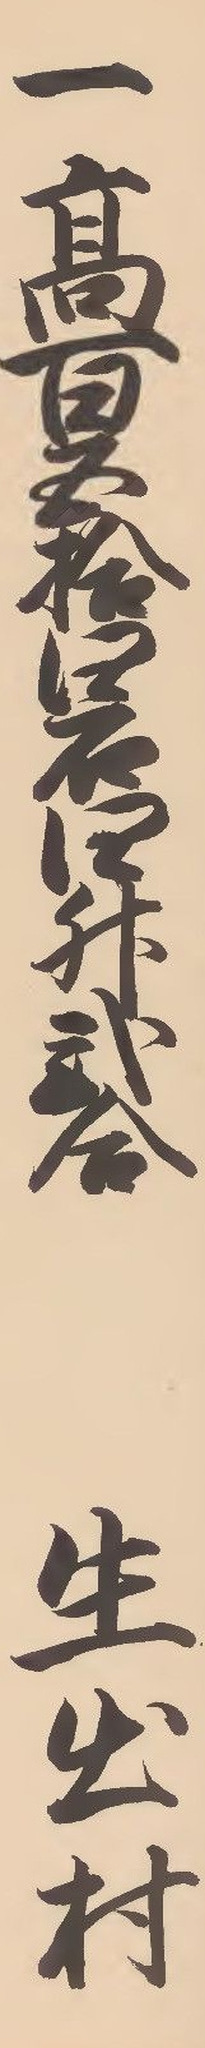一高百五拾四石四升弐合生出村
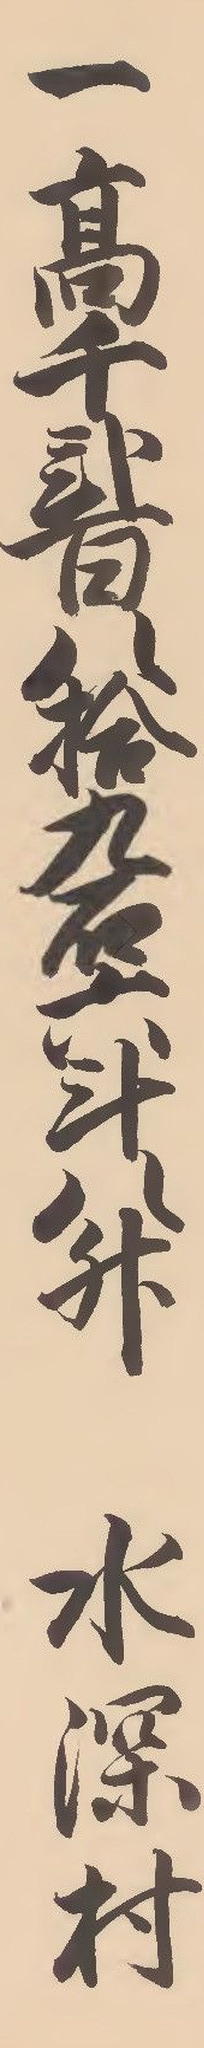一高千弐百八拾九石六斗八升水深村
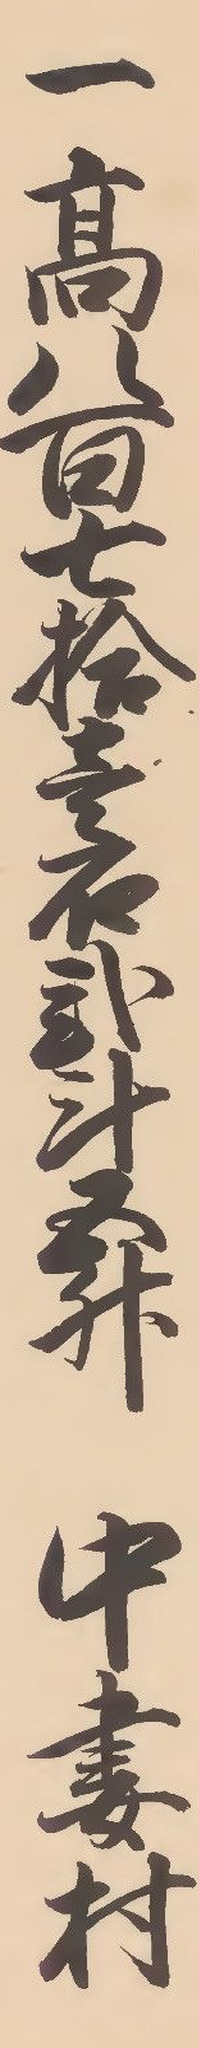一高八百七拾壱石弐斗五升中妻村
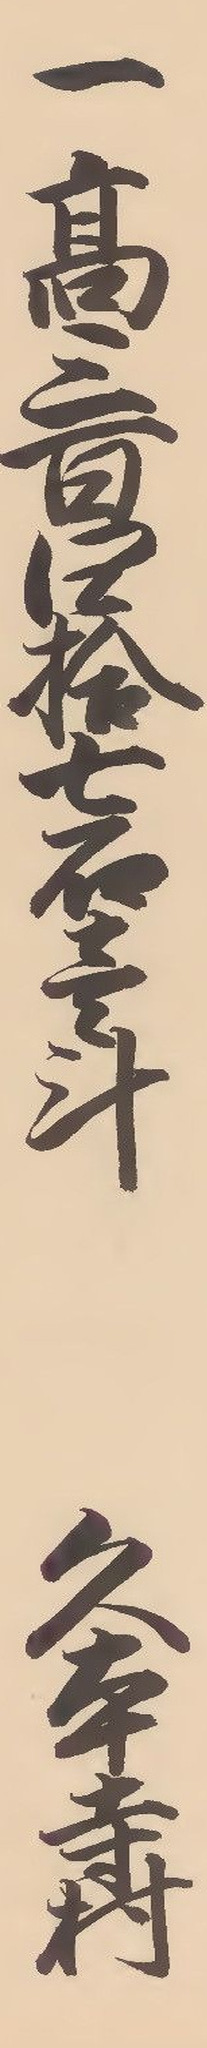一高三百四拾七石壱斗久本寺村

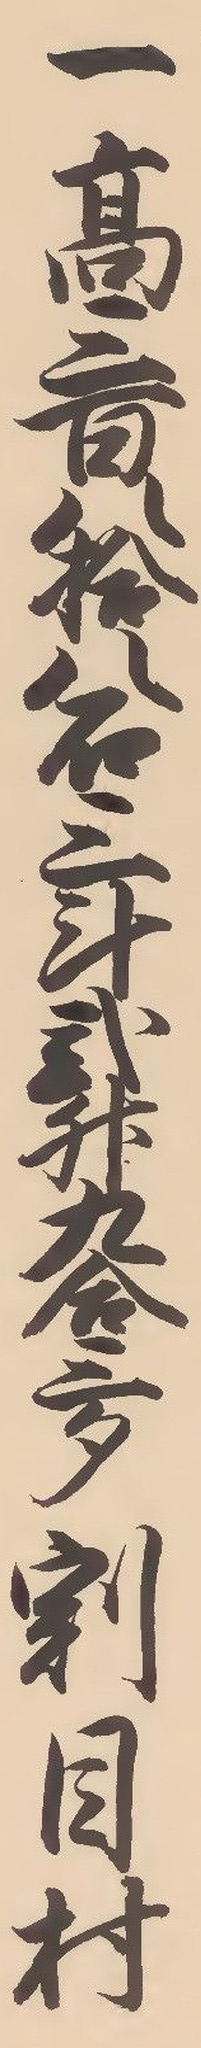一高三百八拾八石三斗弐升九合三勺割目村
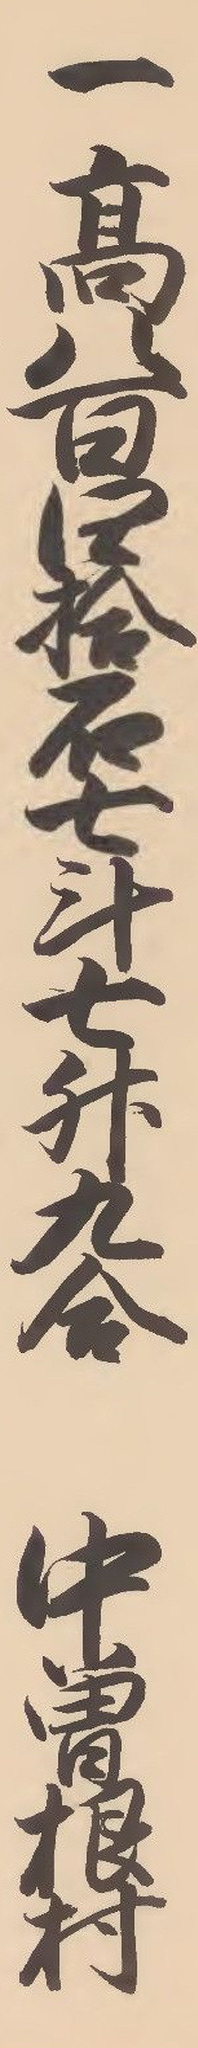一高八百四拾石七斗七升九合中曽根村
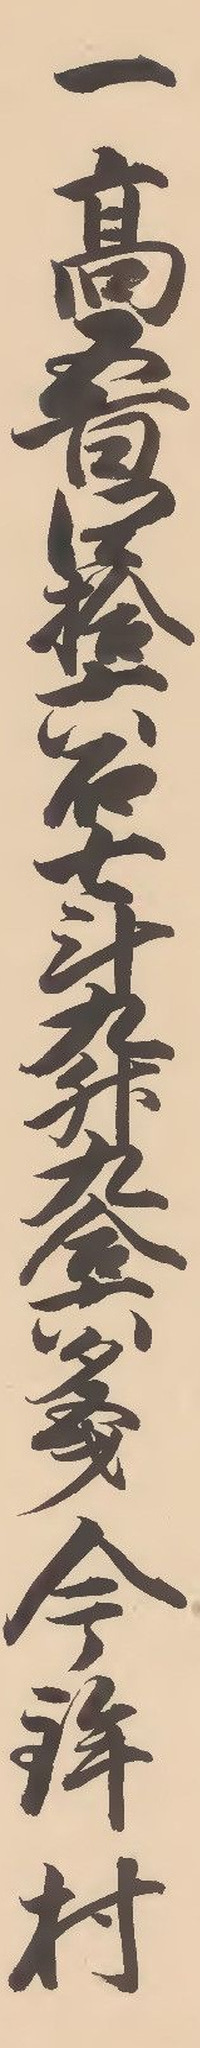一高五百四拾六石七斗九升九合六勺五才今鉾村
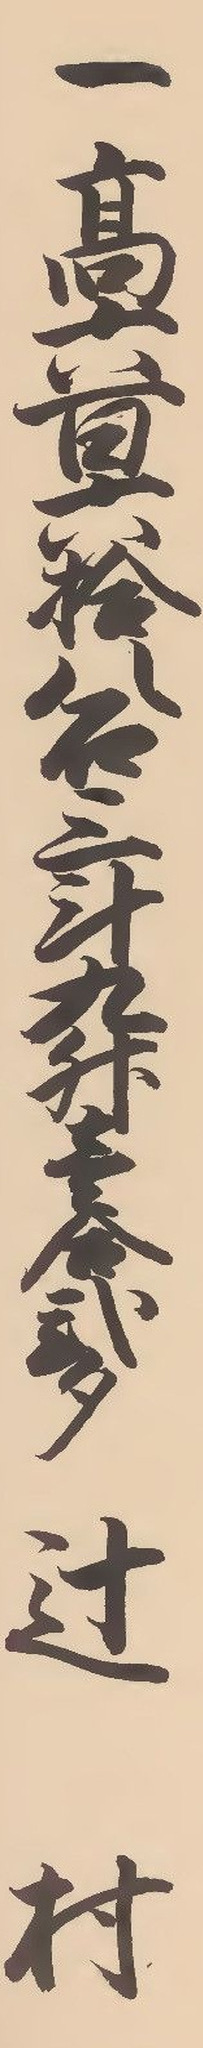一高六百六拾八石三斗九升壱合弐勺辻村
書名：武蔵国郷帳　下
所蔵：国立公文書館 National Archives of Japan
